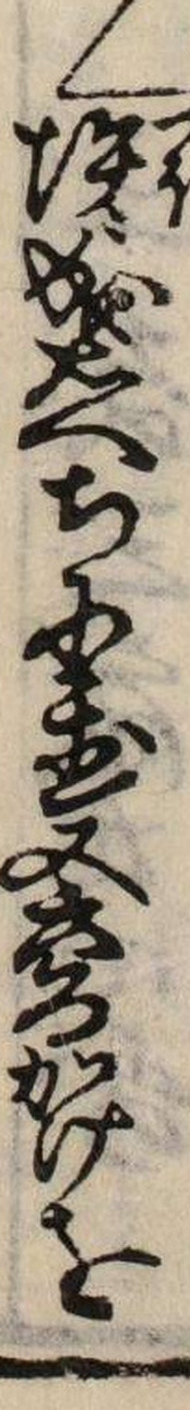坪に成右へちに置又六間かけを
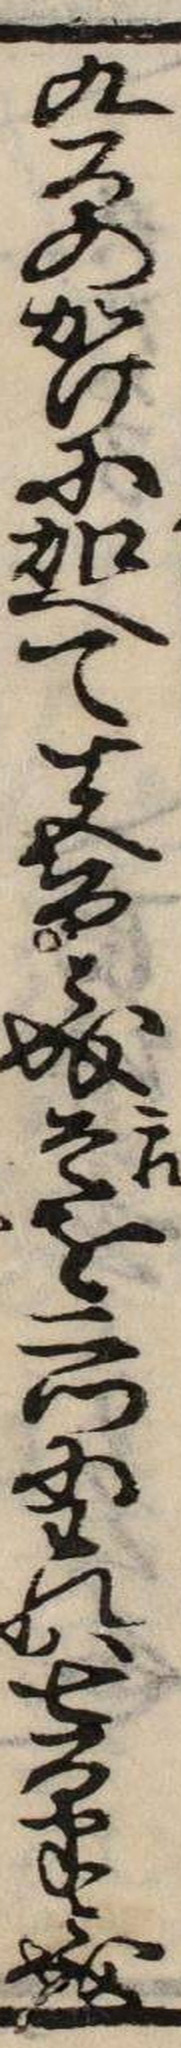九間のかけに加へて十五間と成是を二つにわれは七間半と成
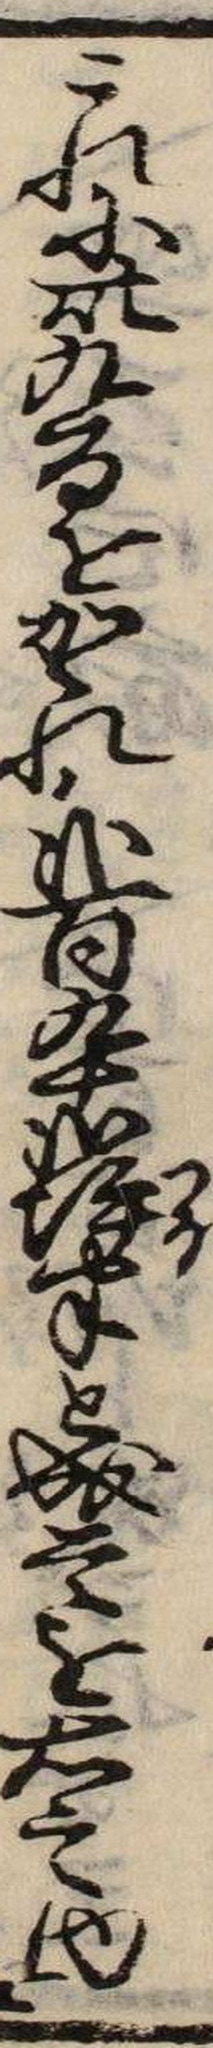これに卅九間をかくれは弐百九十弐坪半と成是を右の内にて
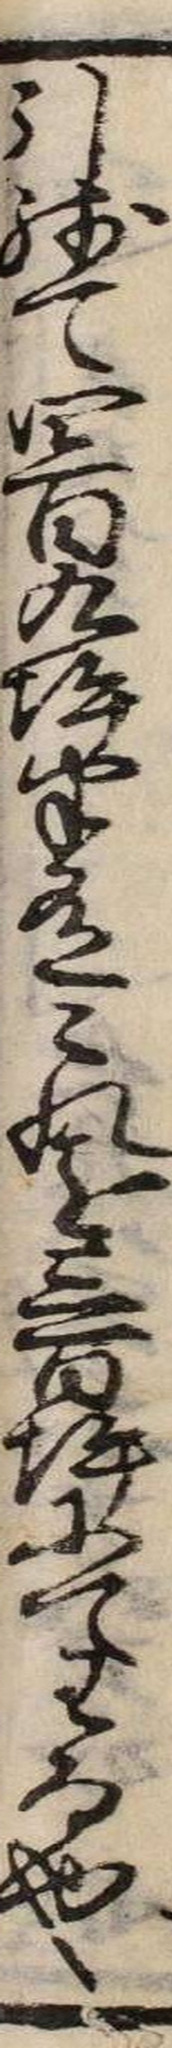引残て四百九坪半有これを三百坪にてわる也
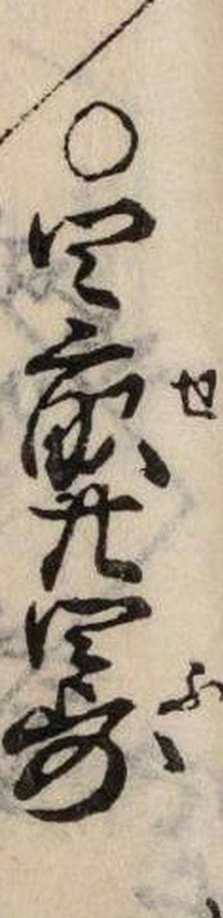○四畝廿四歩
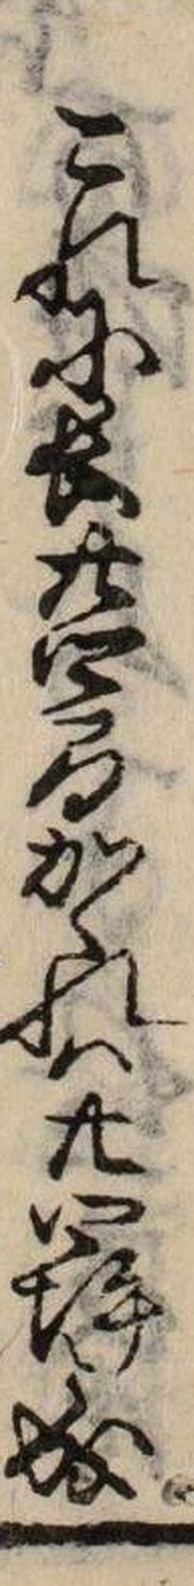これに長廿四間かくれは廿四坪と成
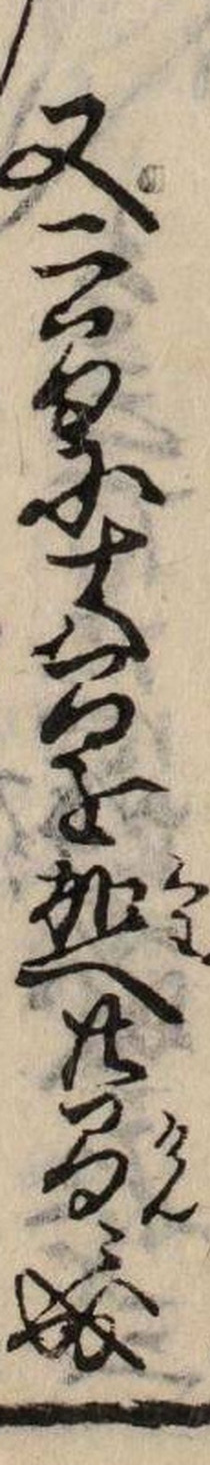又二間に十八間を加へ廿間に成
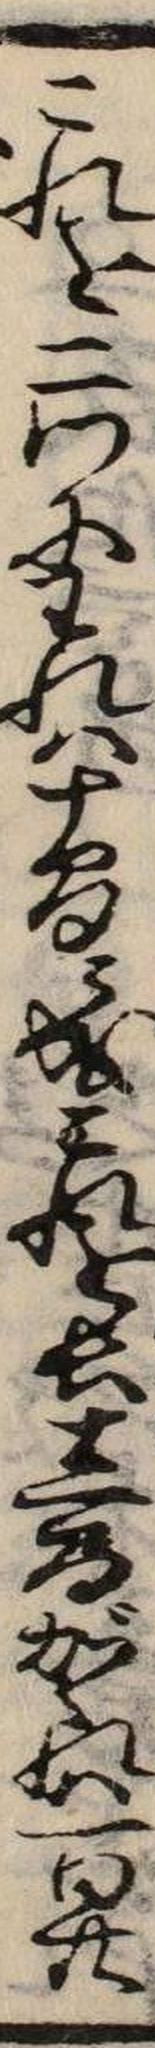これを二つにわれは十間に成これを長十一間にかくれは百廿
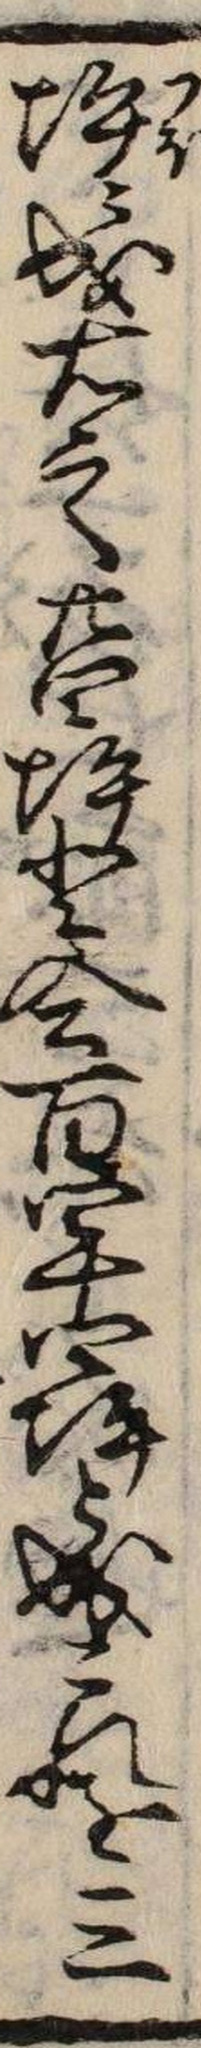坪に成右の廿四坪と合百四十四坪と成これを三
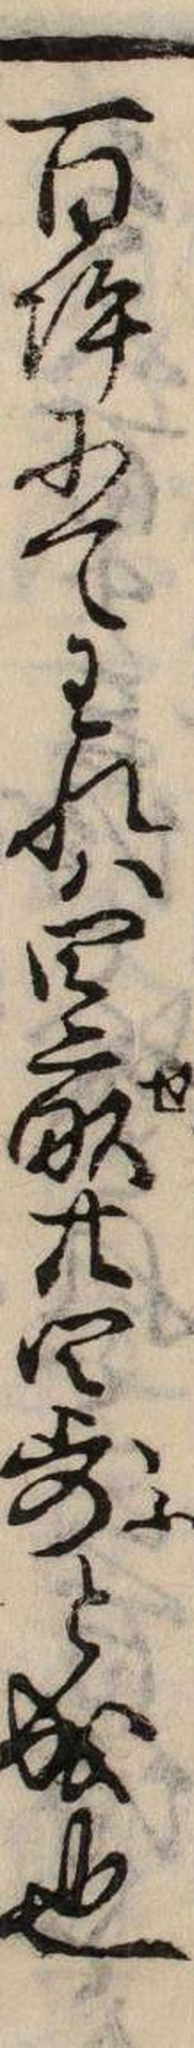百坪にてわれは四畝廿四歩と成也
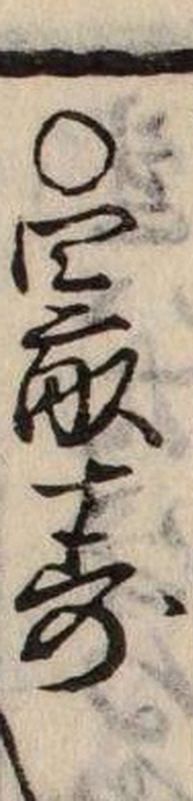○四畝十歩
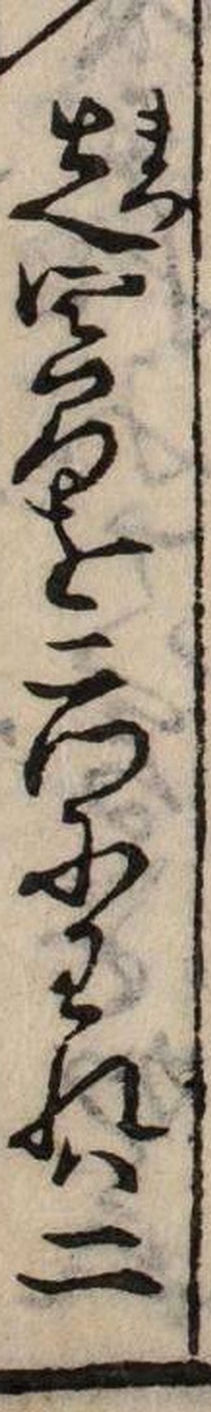先四間を二つにわれは二
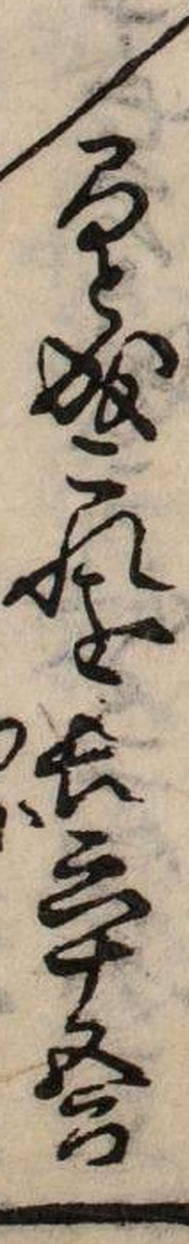間と成これを長三十五間
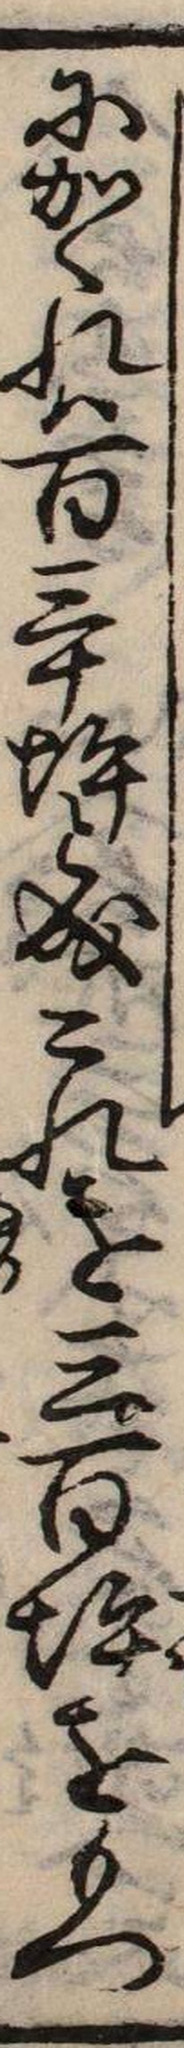にかくれは百三十坪と成これを三百坪をもつ
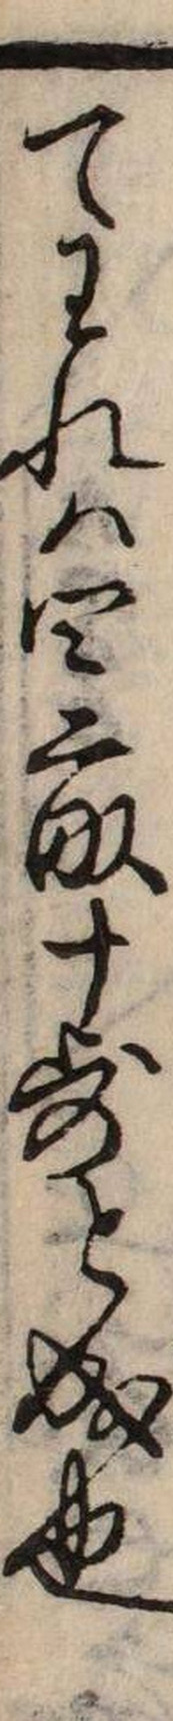てわれは四畝十歩と成也

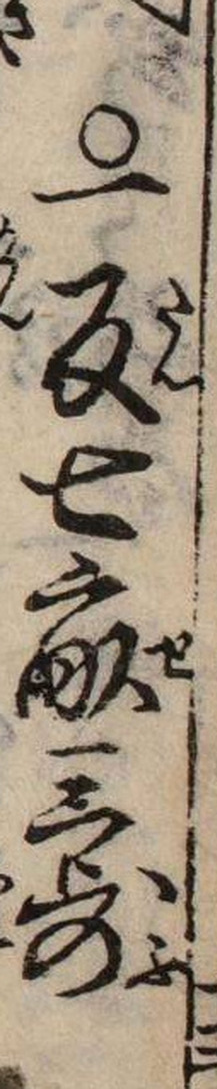○一反七畝一三歩
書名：塵劫記（寛永11年自跋、京都府立京都学・歴彩館追貴8）
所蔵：京都府立京都学・歴彩館 国文学研究資料館
